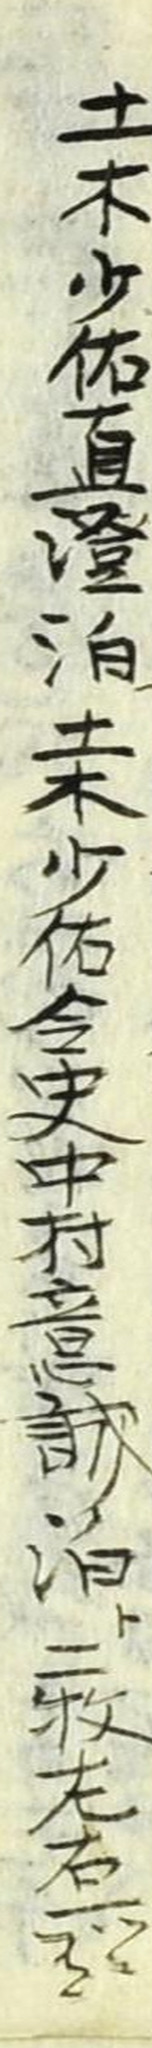土木少佑直澄泊土木少佑令史中村意誠泊ト二枚左右一ツヽ有
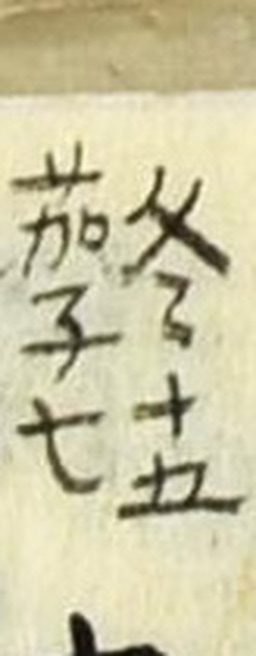茄子七
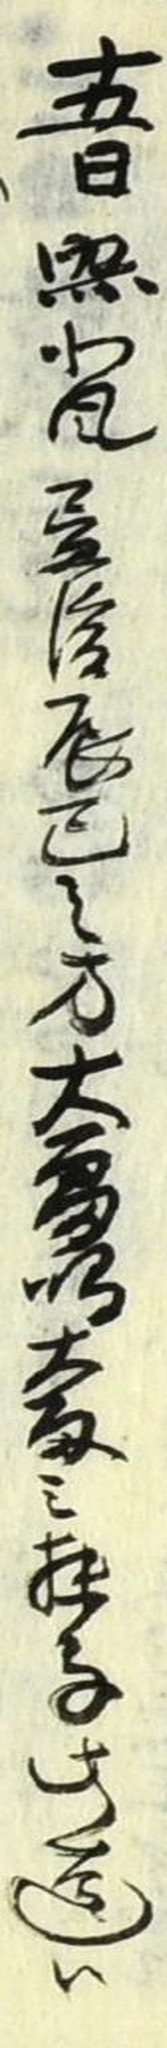十五日照北風昼後辰巳之方大雷鳴大雨之様子此辺ハ
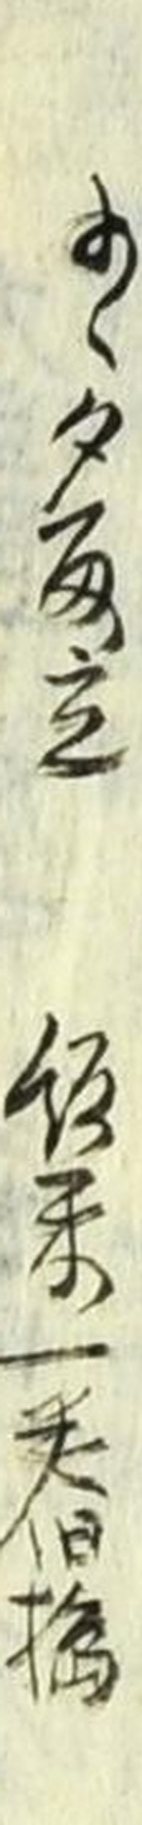少々夕雨立飯米一舂搗
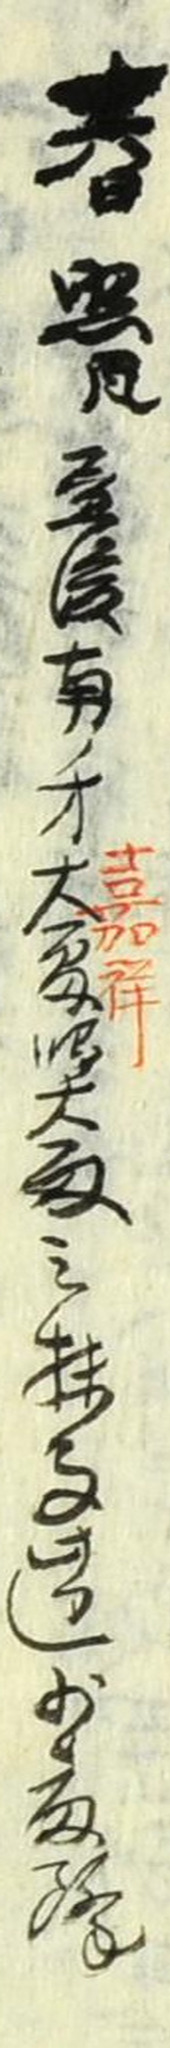十六日照風昼後南ノ方大雷鳴大雨之様子此辺少々雨降
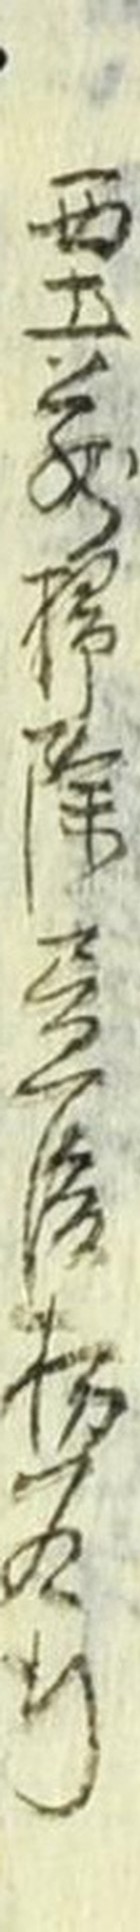西土蔵掃除昼後栃谷行
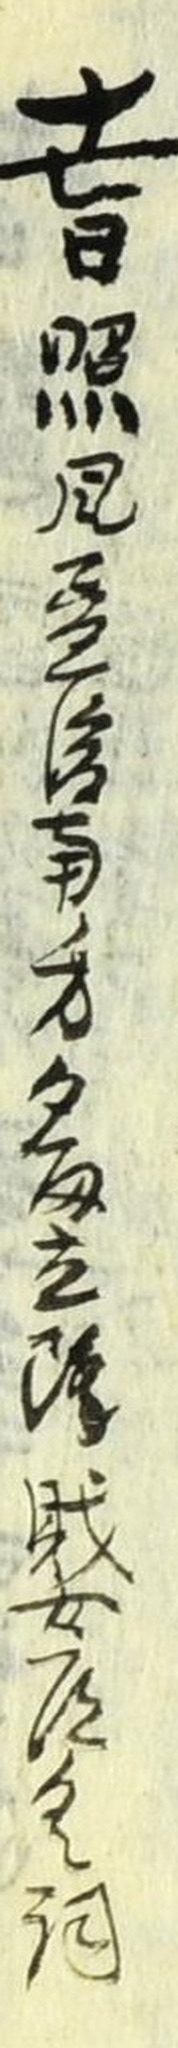十七日照風昼後南ノ方夕雨立降賤女道具調
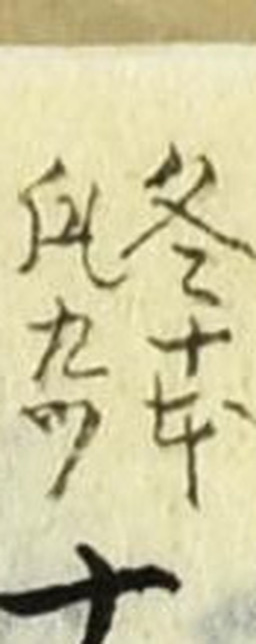瓜九ツ
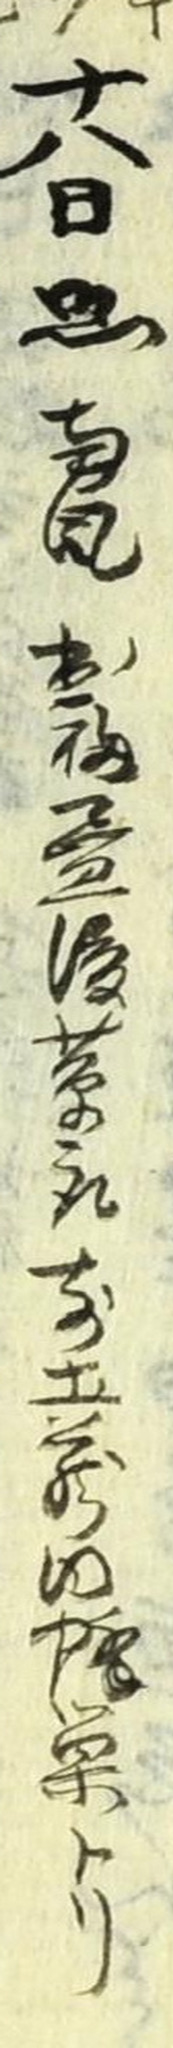十八日照南風出福昼後草取前土蔵内蜂巣トリ
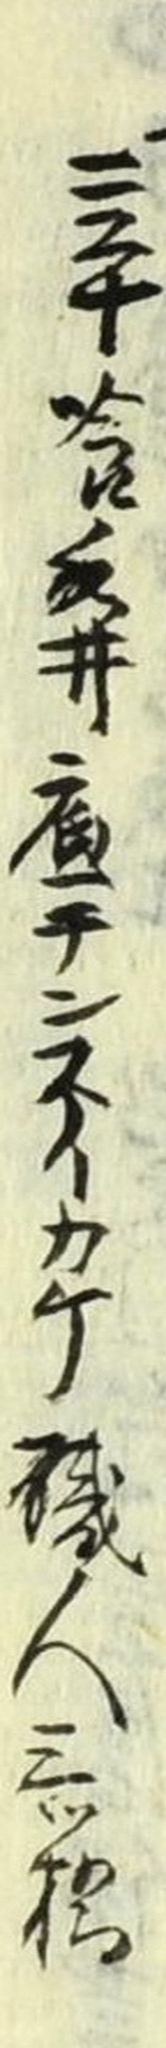二平喰水井底テンスイカケ職人三ツ橋
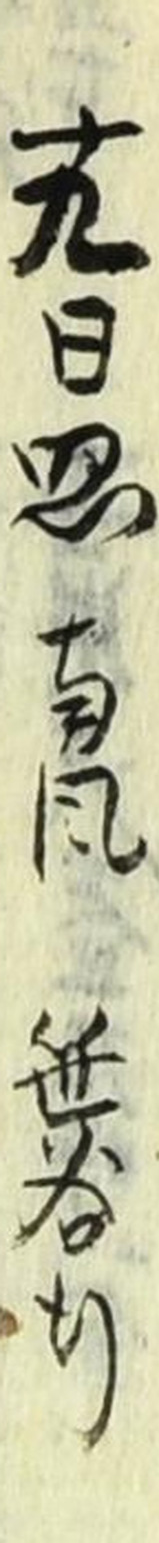十九日照南風笹谷行
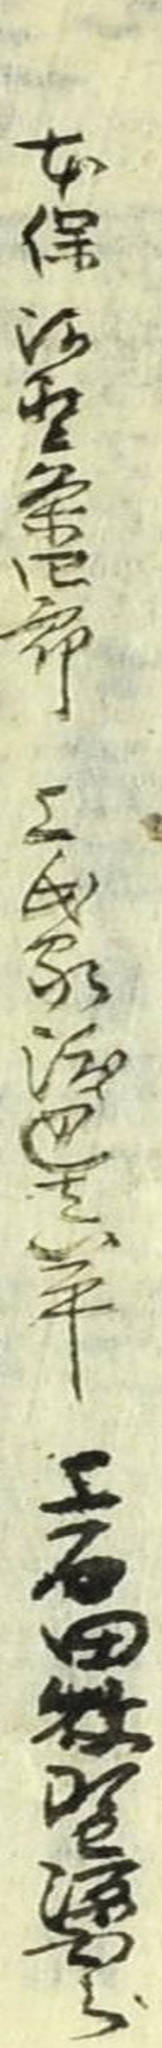本保河野粂四郎上氏家渡辺真平上石田牧野源五郎
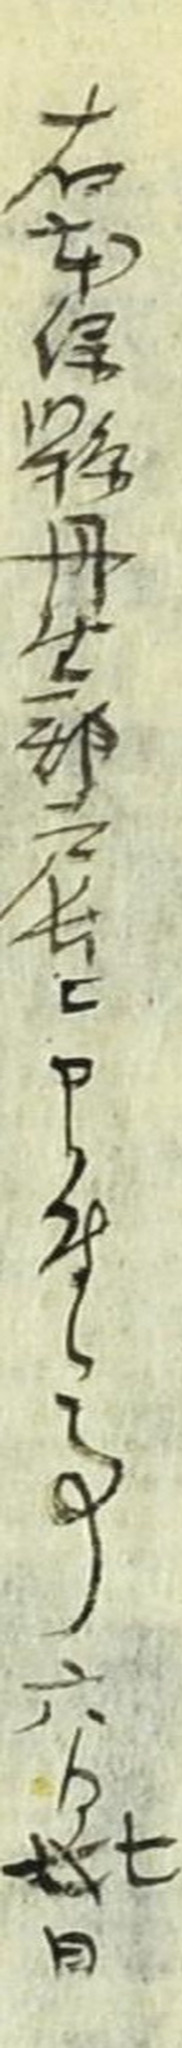右本保県丹生郡戸長被申付候事六日七日
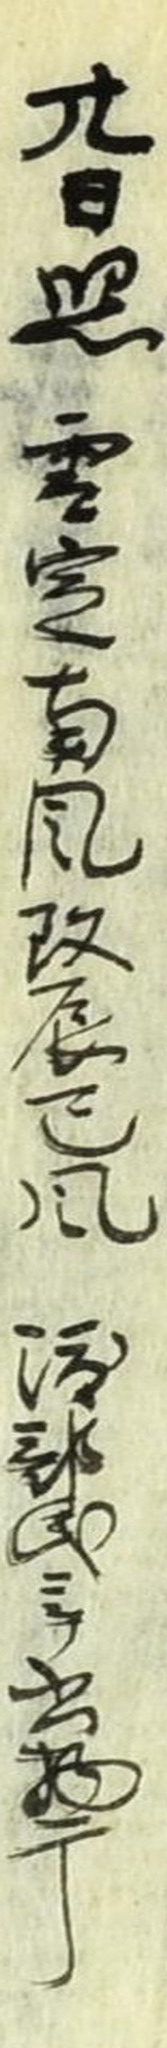廿日照雲定南風改辰巳風渡部氏ニテ書物干
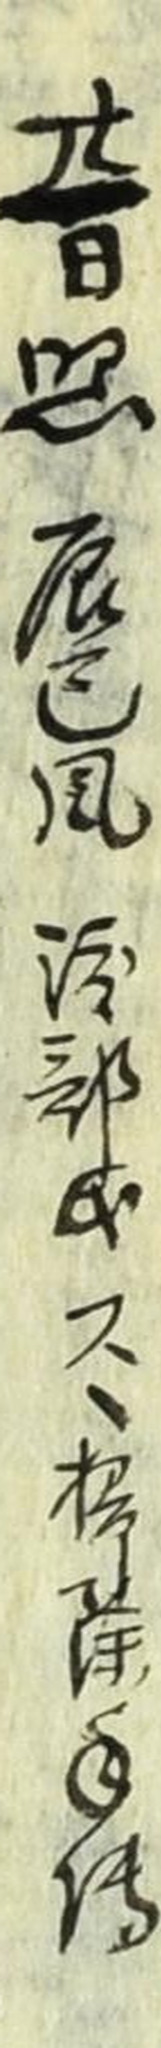廿一日照辰巳風渡部氏スヽ掃除手伝
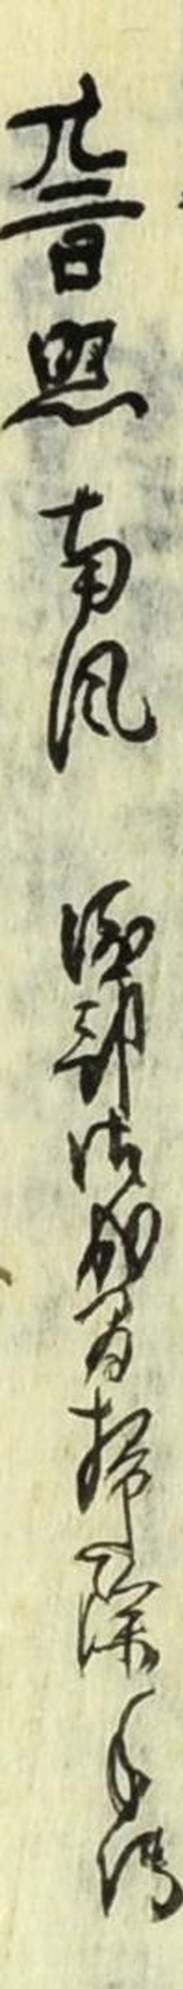廿二日照南風渡部御成間掃除手伝
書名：（日記）
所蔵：福井県文書館 Fukui Prefectural Archives
